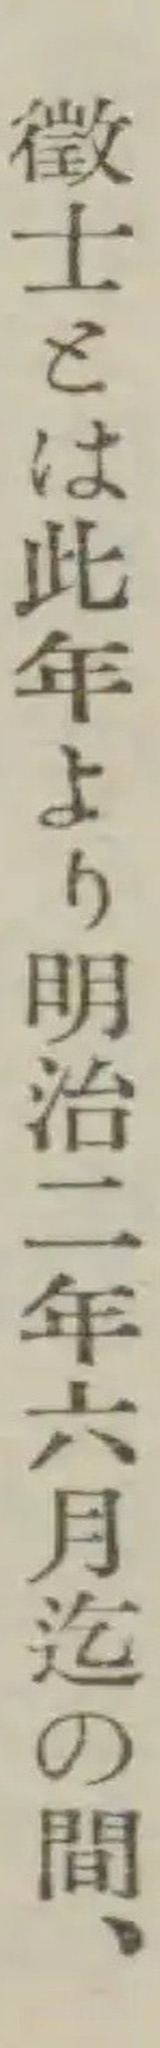徴士とは此年より明治二年六月迄の間、
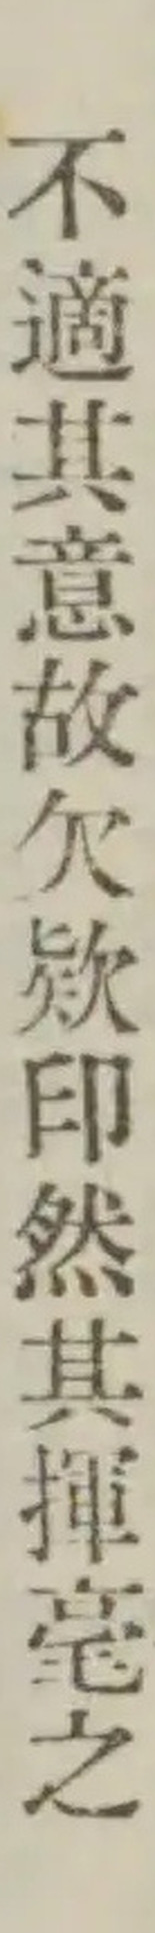不適其意故欠欵印然其揮毫之
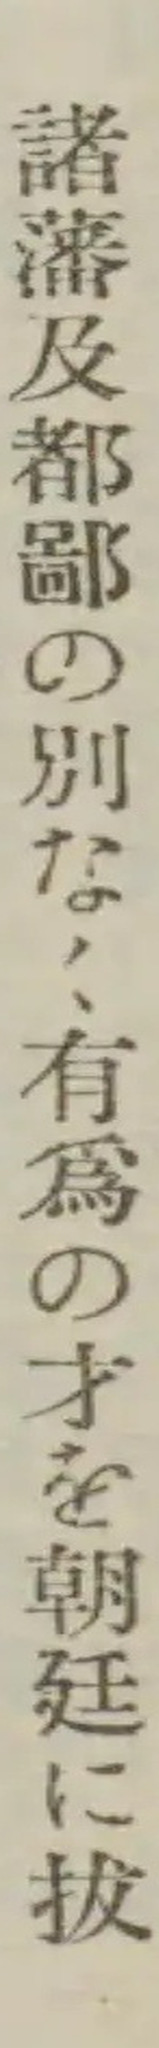諸藩及都鄙の別なく有為の才を朝廷に抜
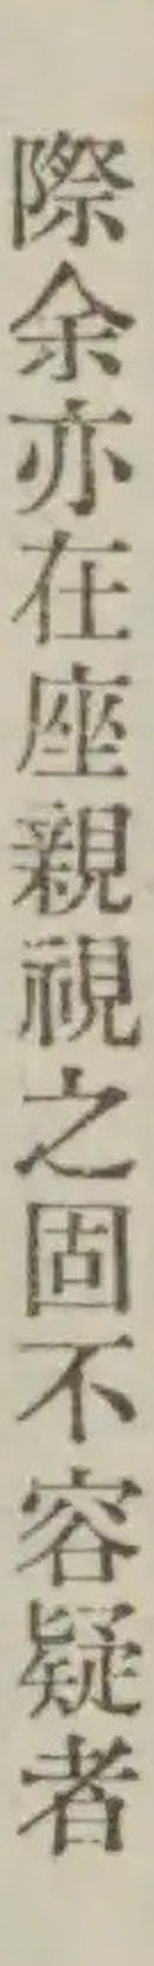際余亦在座親視之固不容疑者
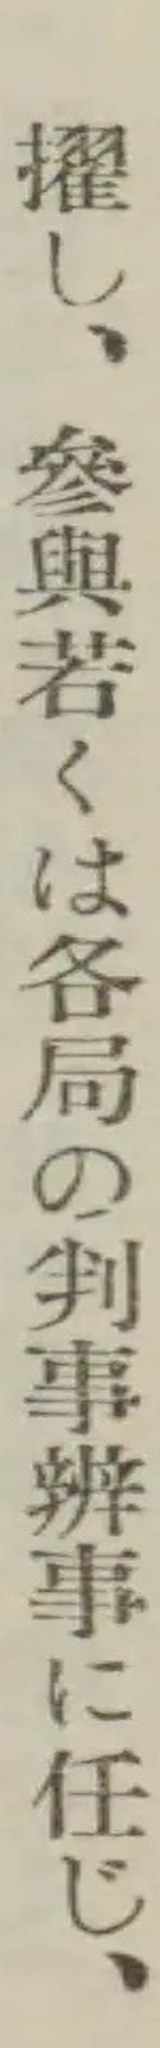擢し、参与若くは各局の判事辨事に任じ、
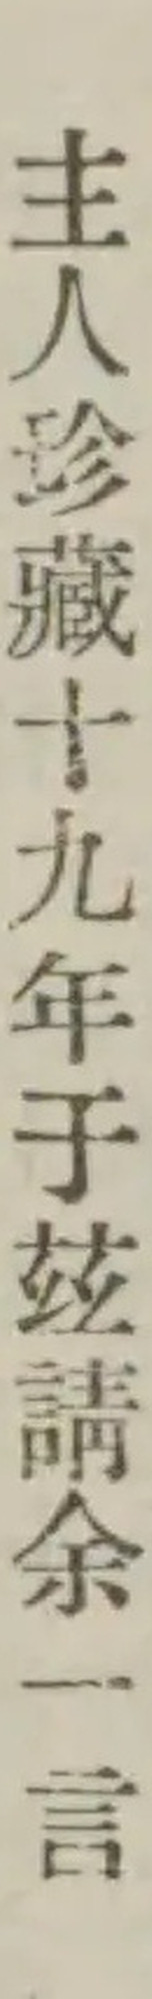主人珍藏十九年于茲請余一言
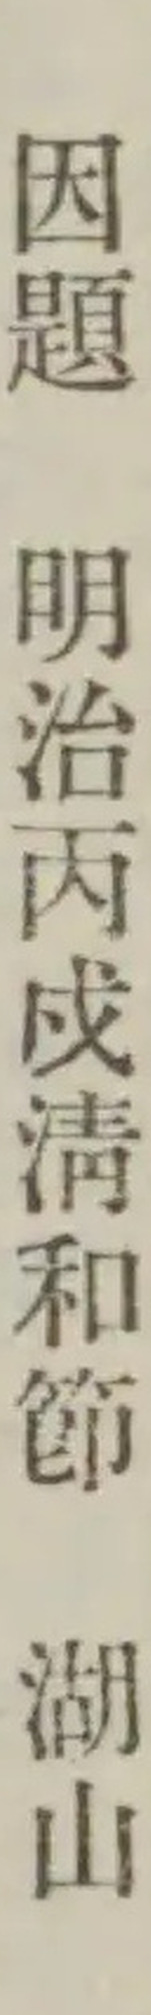因題明治丙戌清和莭湖山
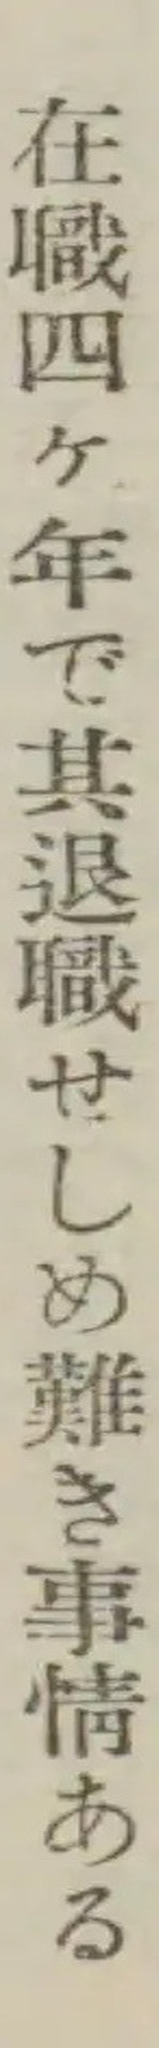在職四ヶ年で其退職せしめがたき事情ある
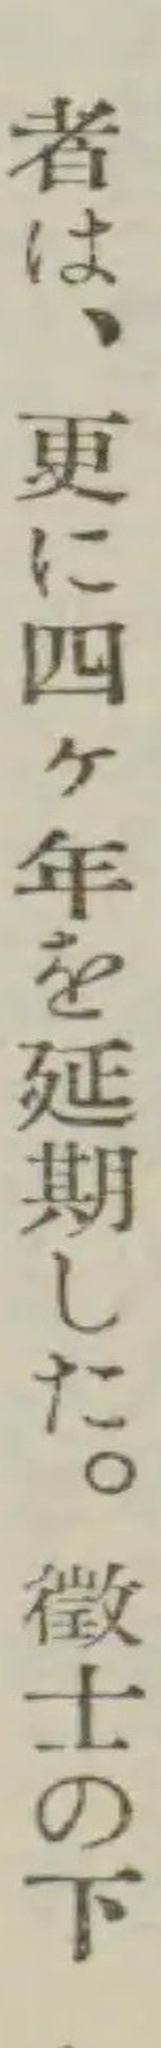者は、更に四ヶ年を延期した。徴士の下
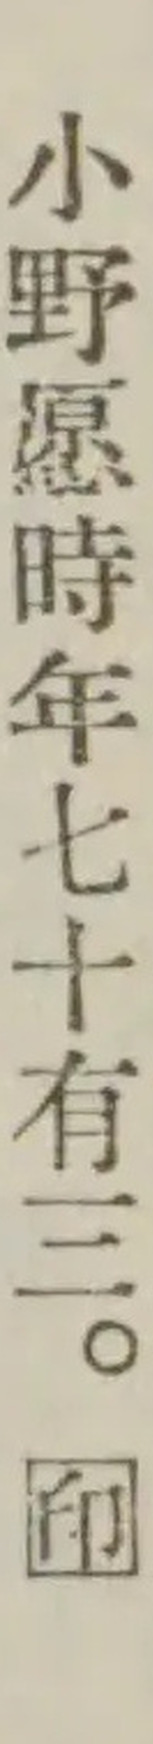小野愿時年七十有三。印
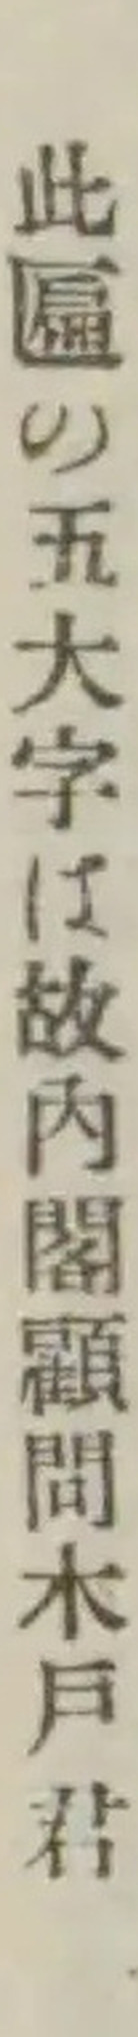此匾五大字故内閣顧問木戸君
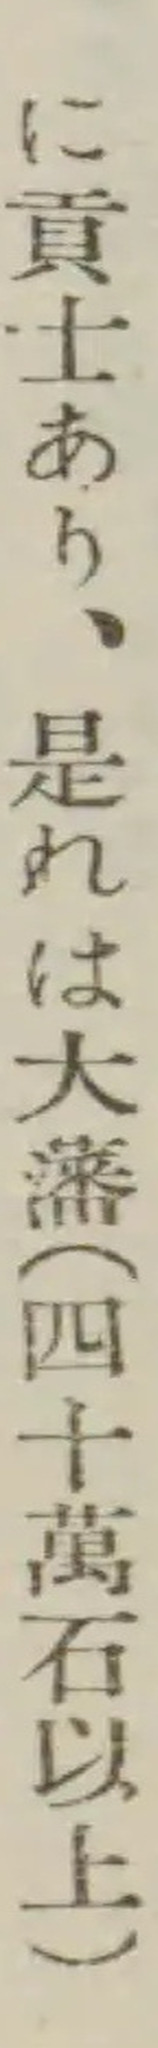に貢士あり、是れは大藩(四十万石以上)
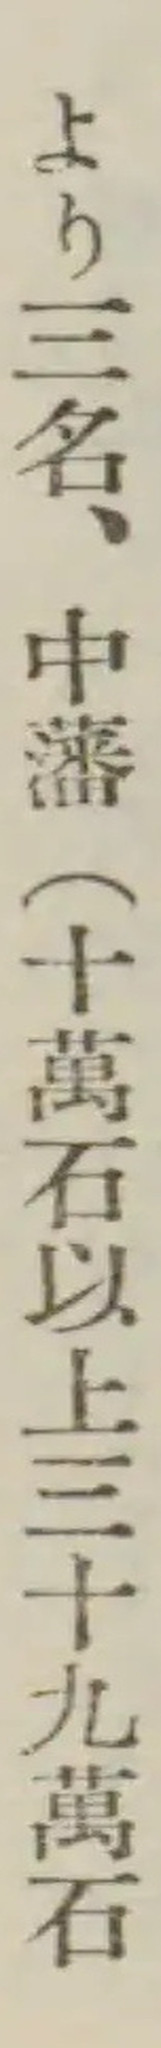より三名、中藩(十万石以上三十九万石
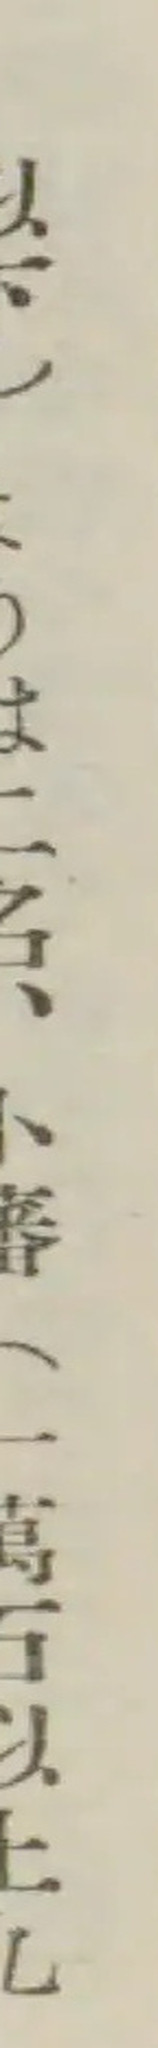以下)よりは二名、小藩(一万石以上九
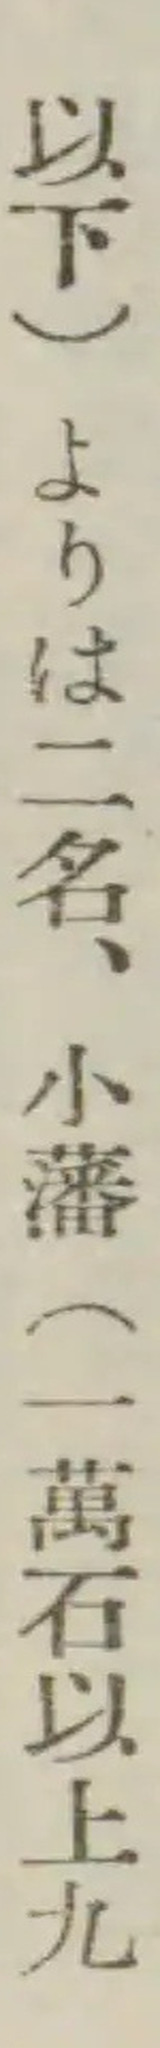以下)よりは二名、小藩(一万石以上九
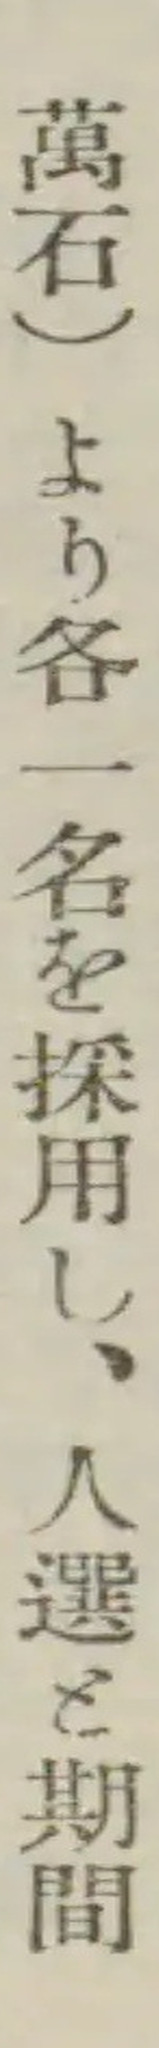万石)より各一名を採用し、人選と期間
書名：小野湖山翁小伝
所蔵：国立国会図書館 National Diet Library, JAPAN
